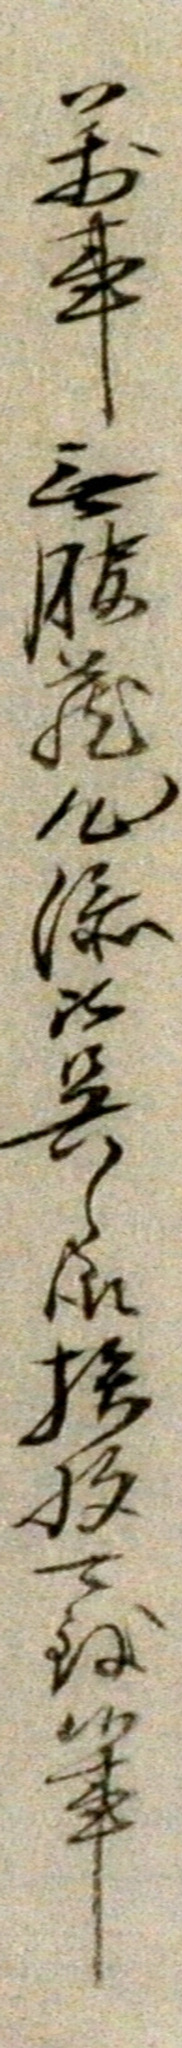万事無腹蔵心添被呉候様挨拶可致候事
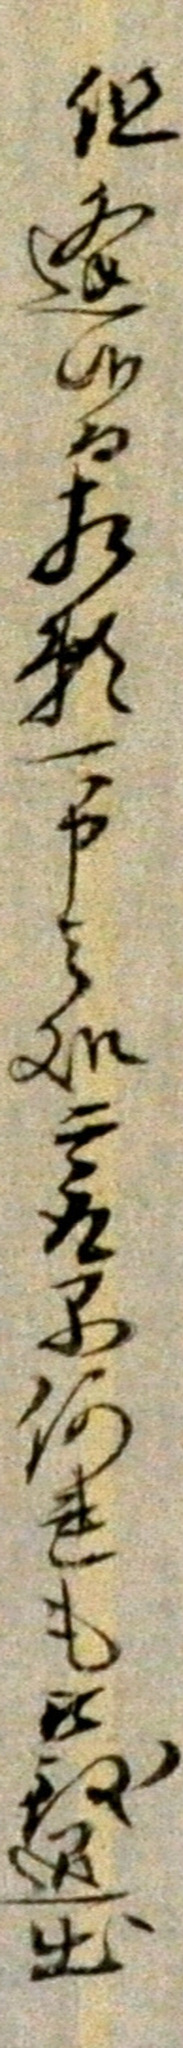但逢候而相頼可申之処最早何れも被致退出
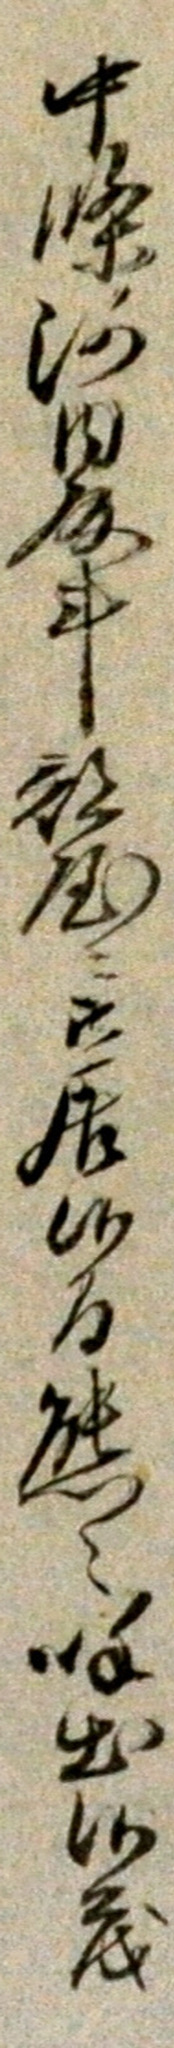中條河内殿計部屋ニ被居候間態々呼出候も
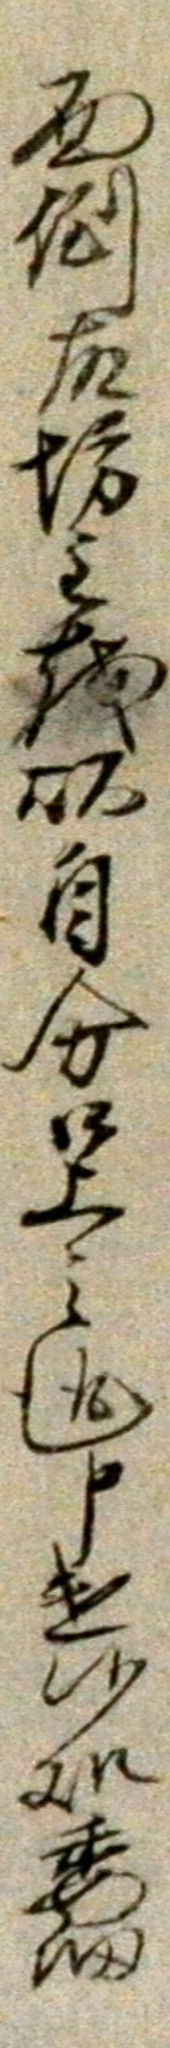面倒故坊主を以自分口上之趣申遣候処委細
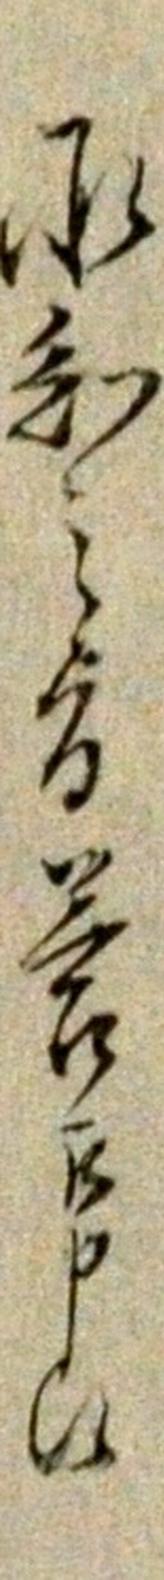承知之旨答被申候
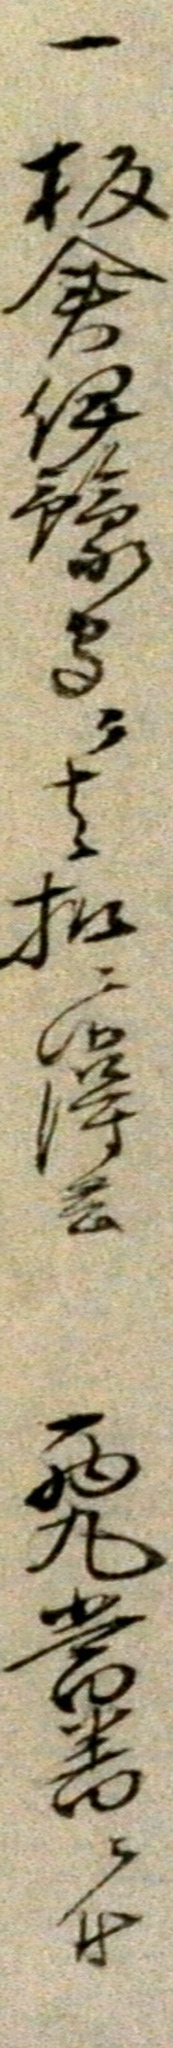一板倉伊豫守ニは扣ニ候得共西丸当番ニ付
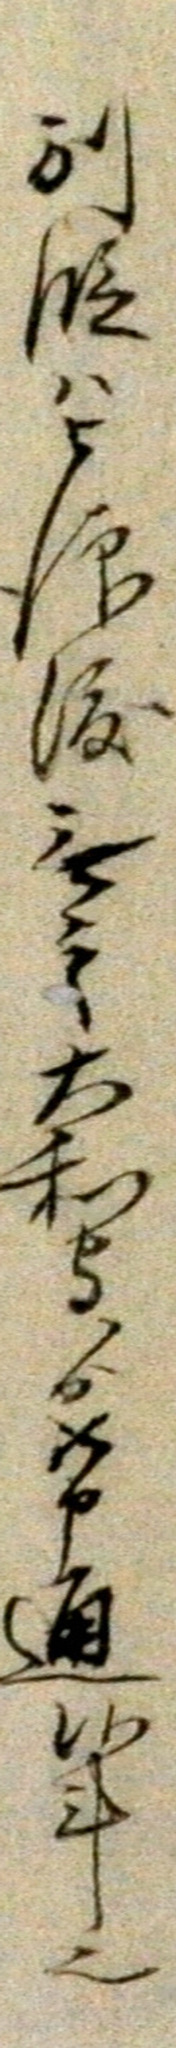別段ハ被仰渡無之大和守ゟ被申通候計也
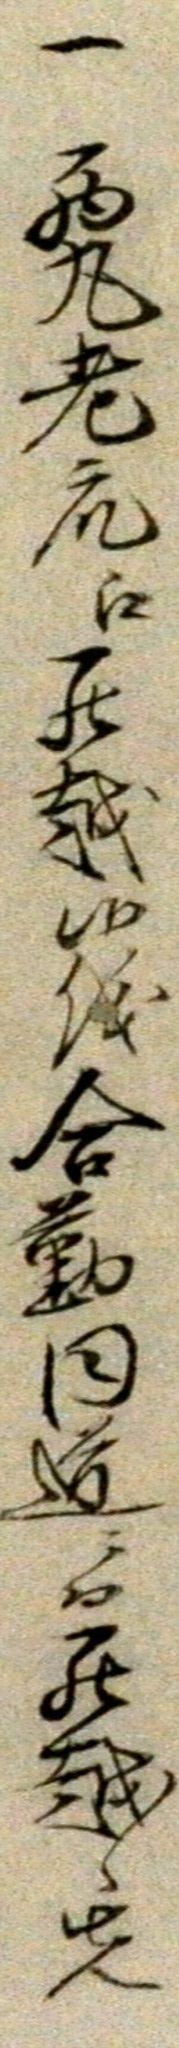一西丸老衆え罷越候儀合勤同道ニ而罷越候先
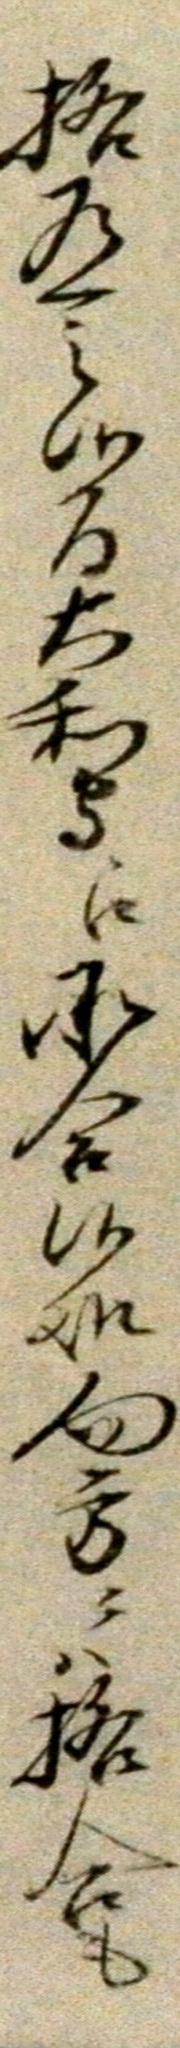格有之候間大和守え承合候処向方ニハ格合も
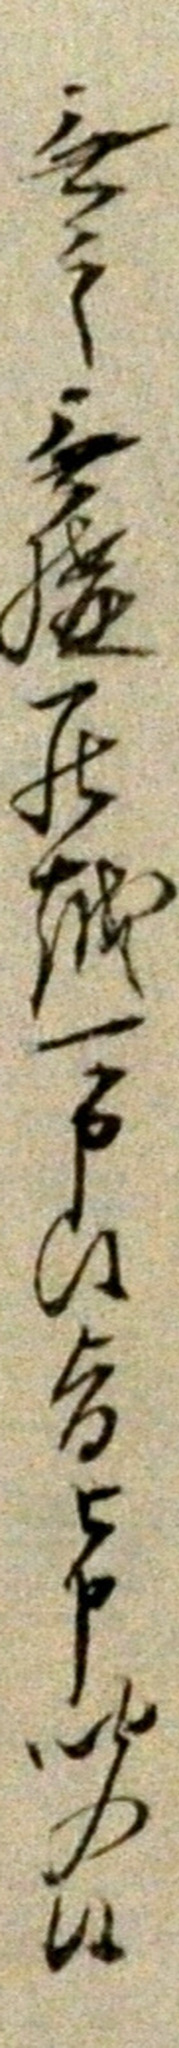無之無構罷越可申候旨被申聞候
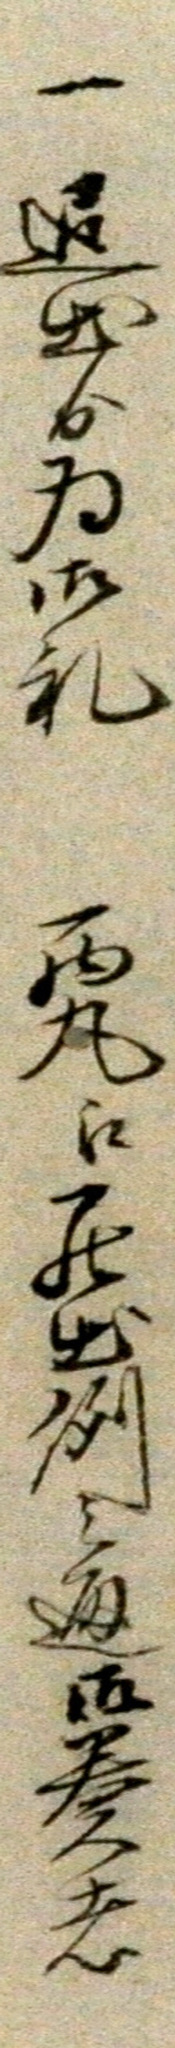一退出ゟ為御礼西丸え罷出例之通御奏者
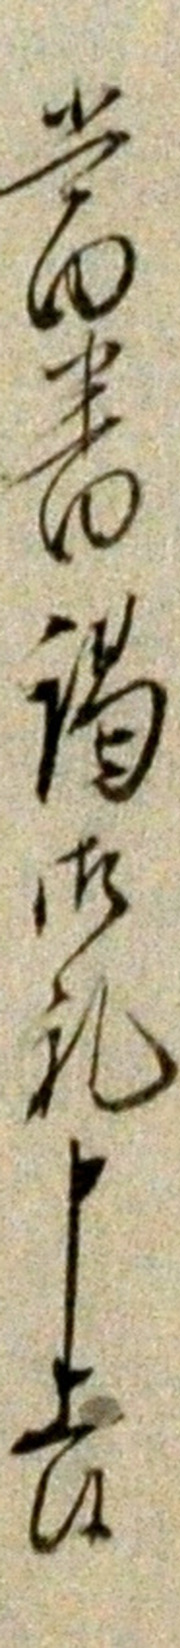当番謁御礼申上候
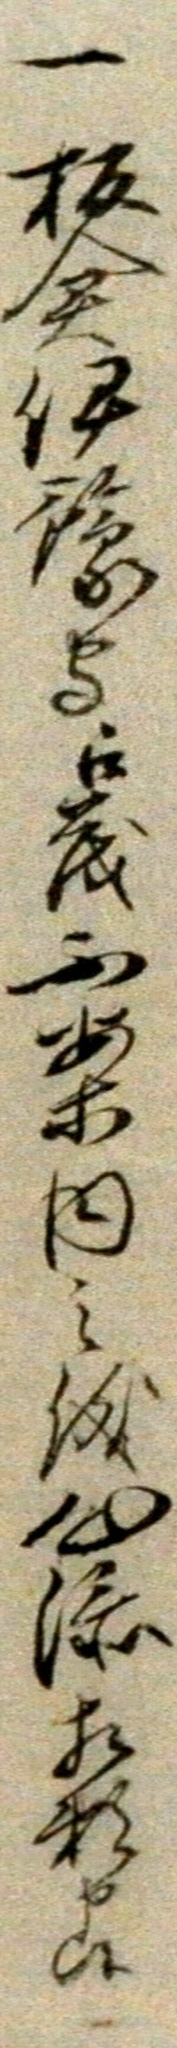一板倉伊豫守えも不案内之儀心添相頼申候
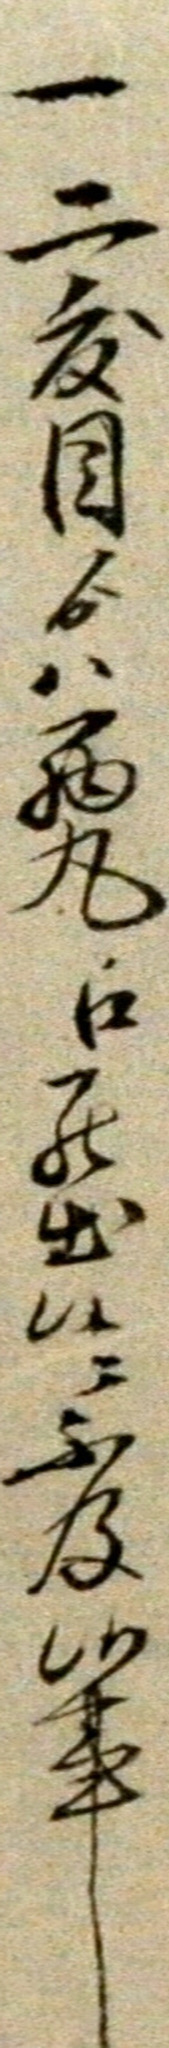一二度目ゟハ西丸え罷出候ニ不及候事
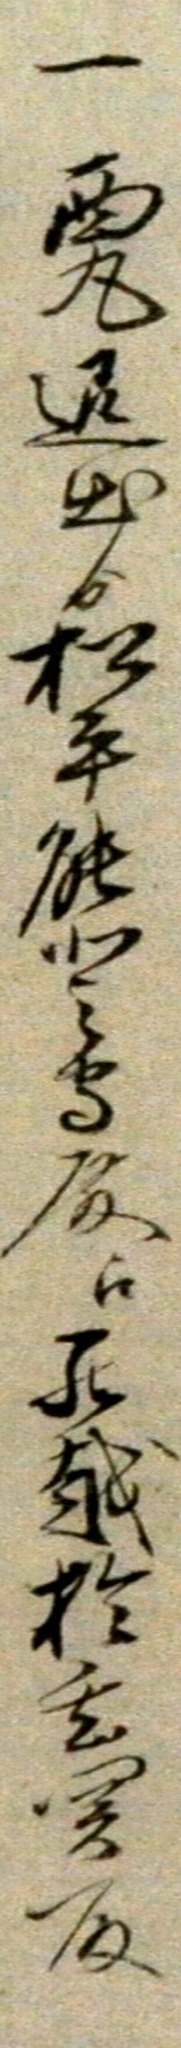一西丸退出ゟ松平能登守殿え罷越於玄関取
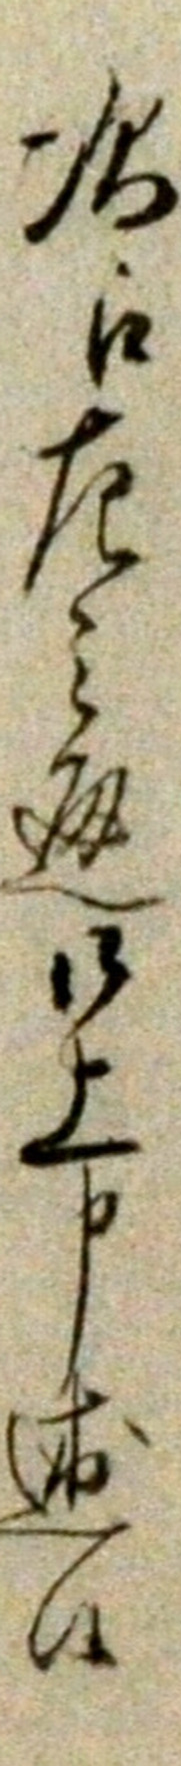次え左之通口上申述候
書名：御鏡餅御用留（写）
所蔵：伊那市立高遠町図書館・合同会社AMANE
